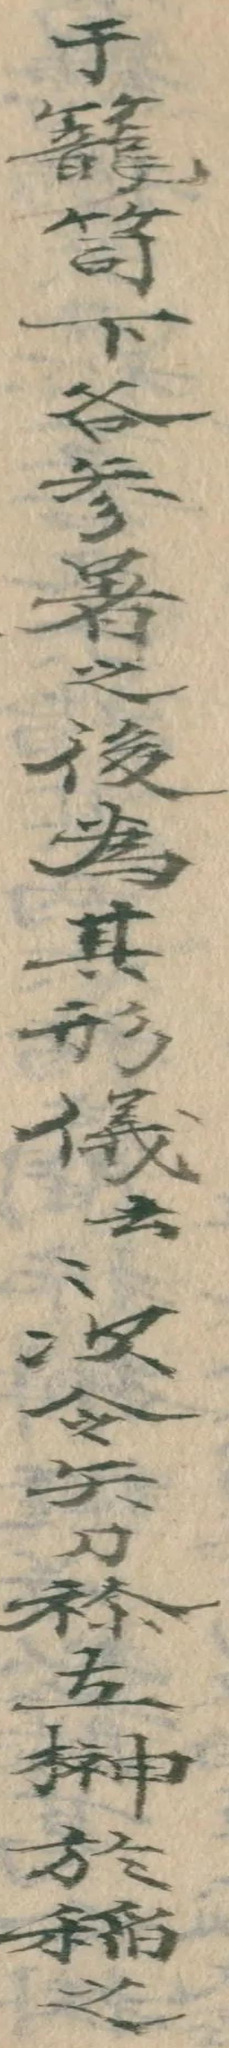于籠笥下各参着之後為其形儀云々次令矢刀祢立榊於稲之

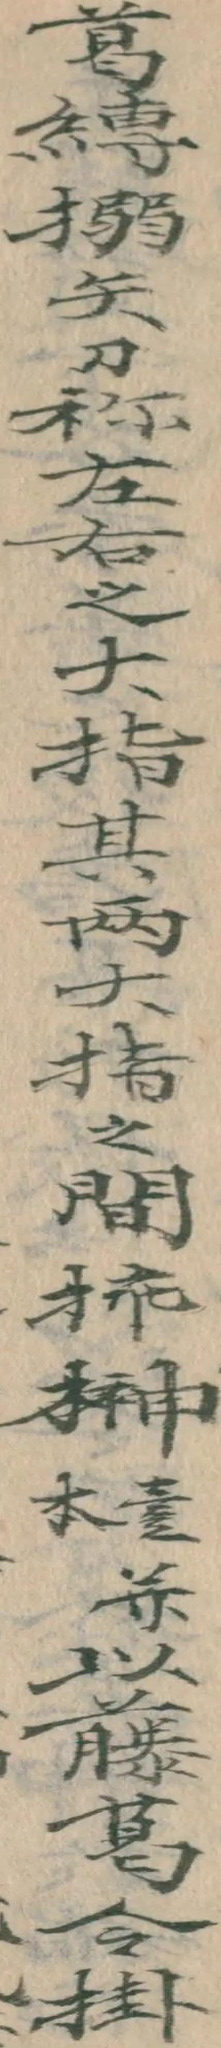葛縛搦矢刀祢左右之大指其両大指之間挿榊壱本并以藤葛令掛
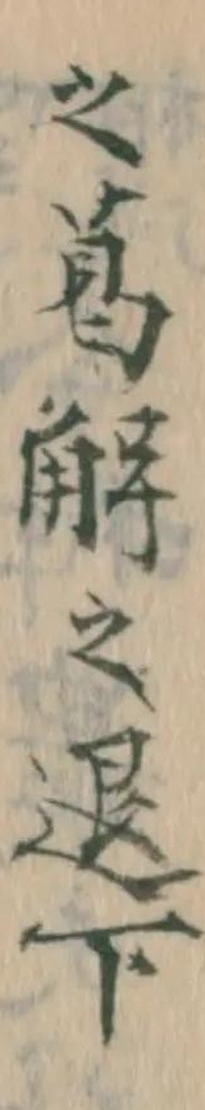之葛解之退下
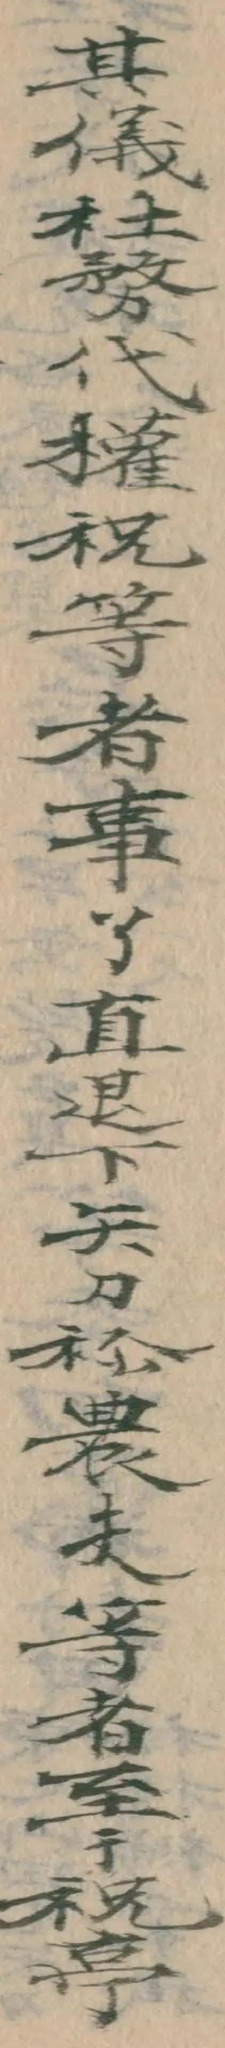其儀社務代権祝等者事了直退下矢刀祢農夫等者至于祝亭
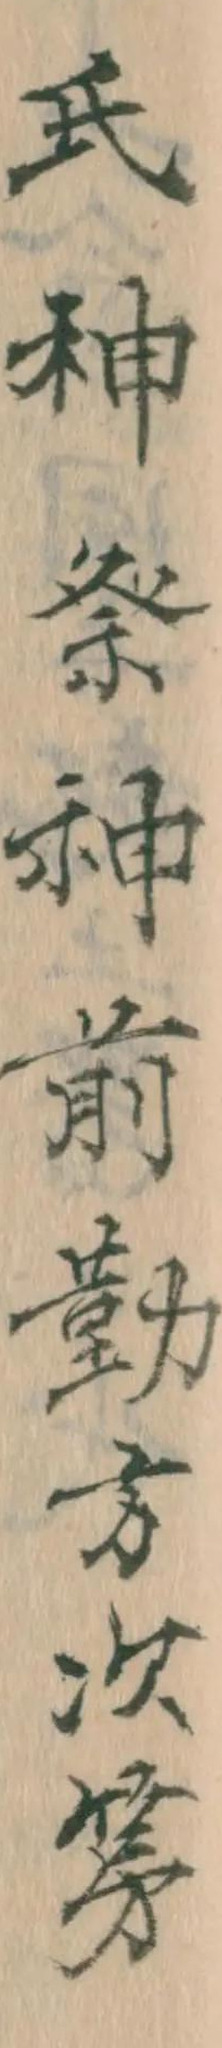氏神祭神前勤方次第
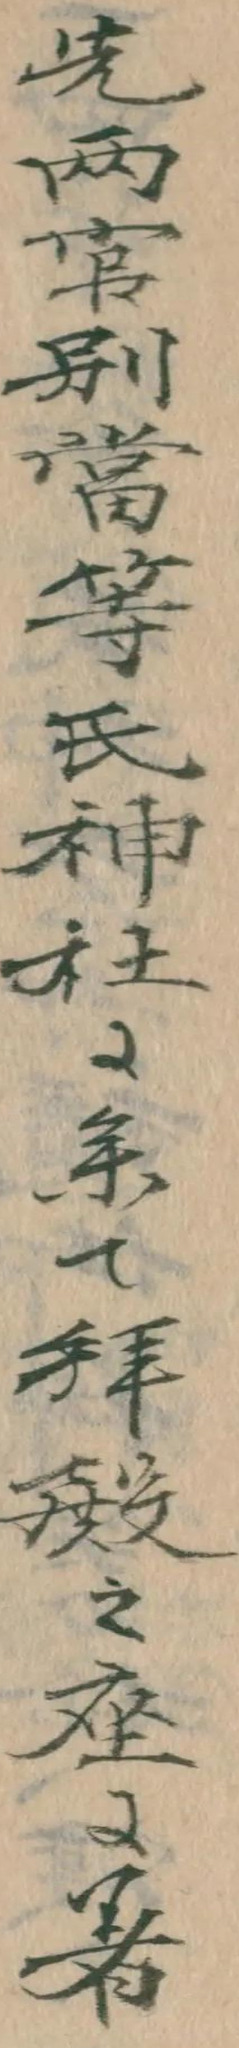先両官別当等氏神社に参て拝殿之座に着
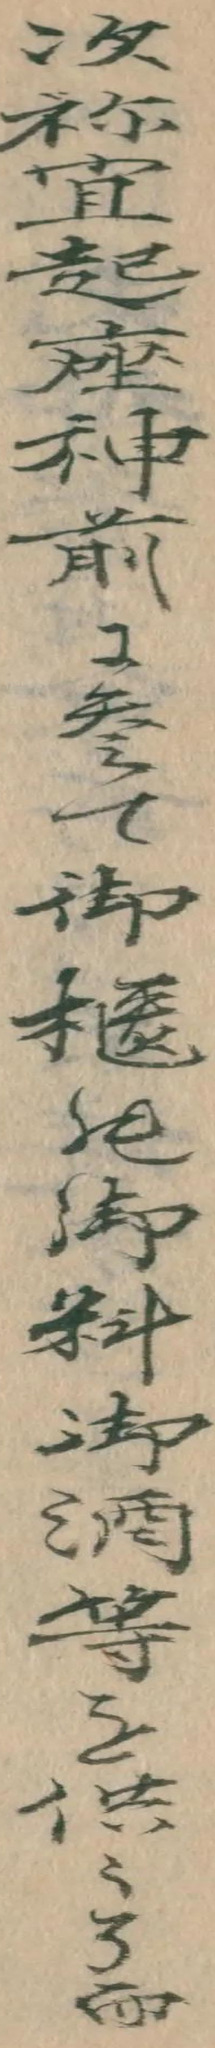次祢宜起座神前に参て御櫃の御料御酒等を供う了而
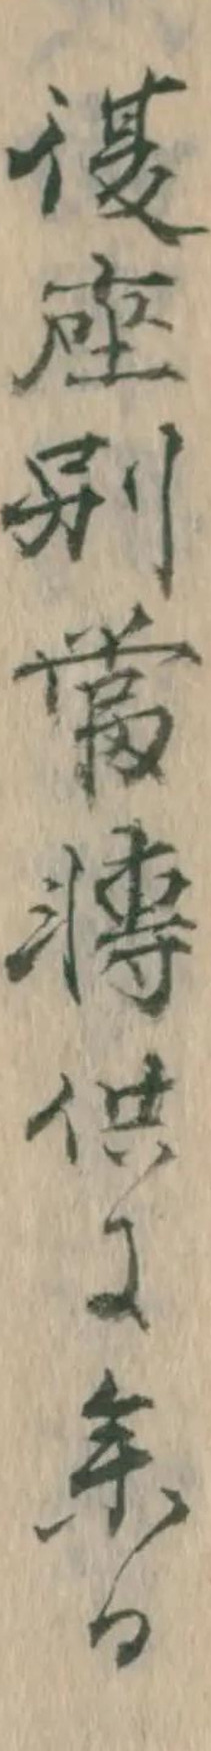復座別当転供に参る
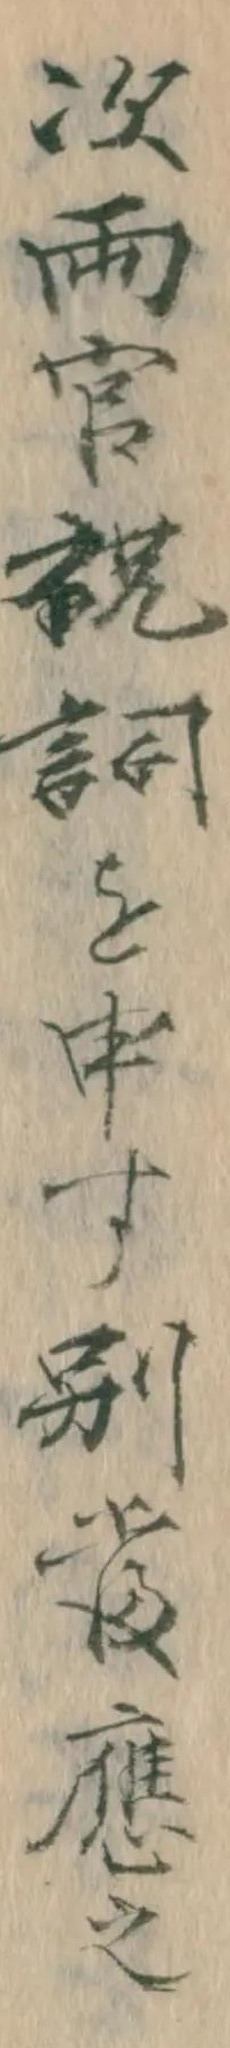次両官祝詞を申す別当応之
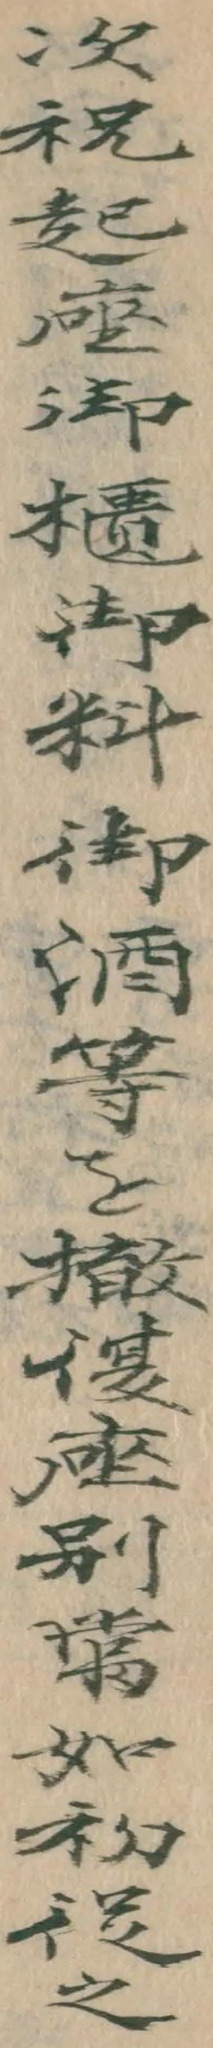次祝起座御櫃御料御酒等を撤復座別当如初従之
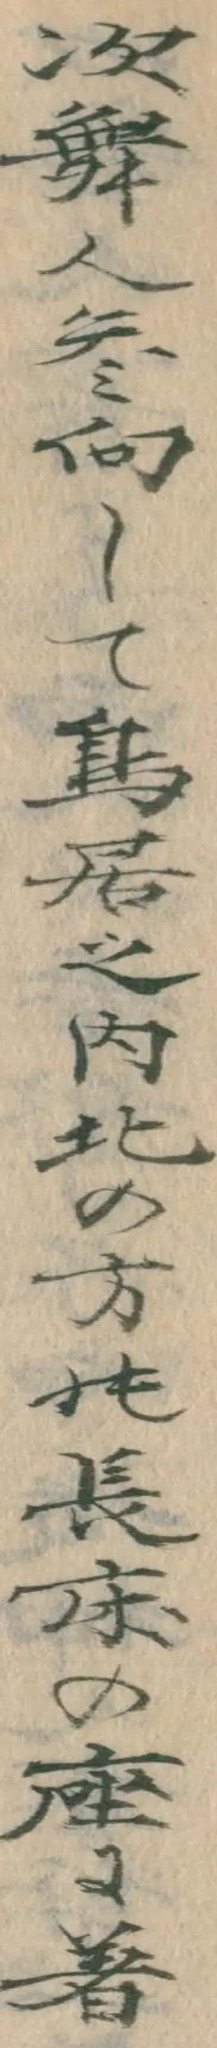次舞人参向して鳥居之内北の方の長床の座に着
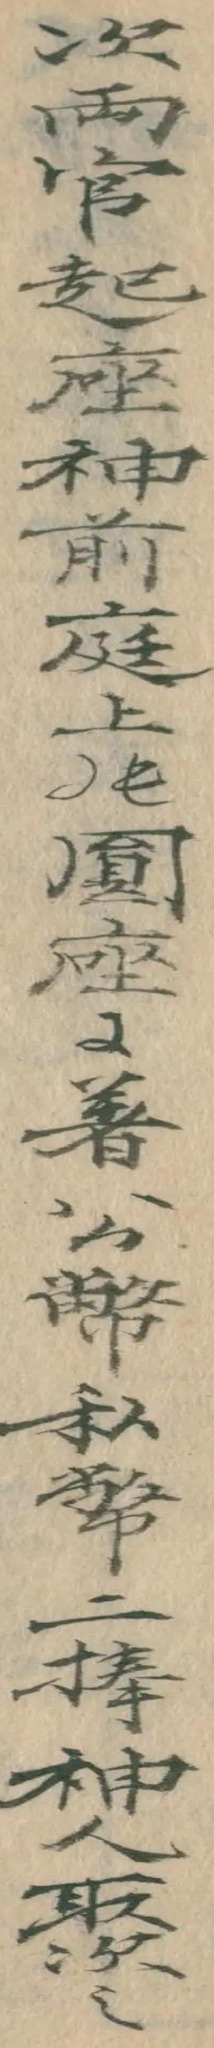次両官起座神前庭上の円座に着公幣私幣二棒神人取次之
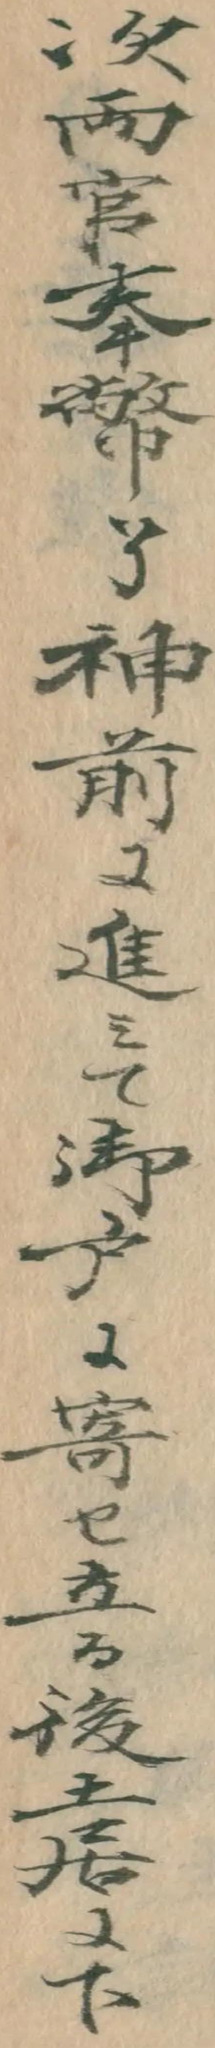次両官奉幣了神前に進みて御戸に寄せ立る後土居に下

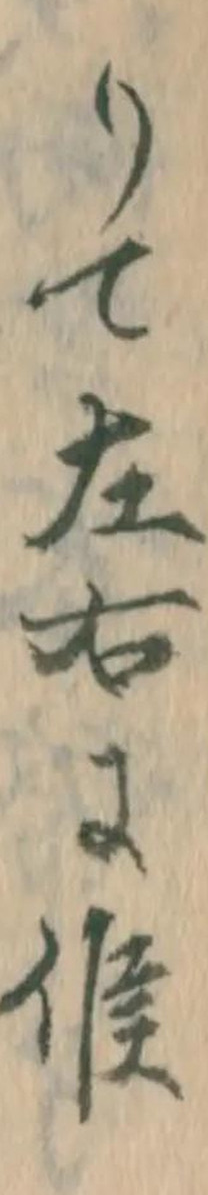りて左右に候
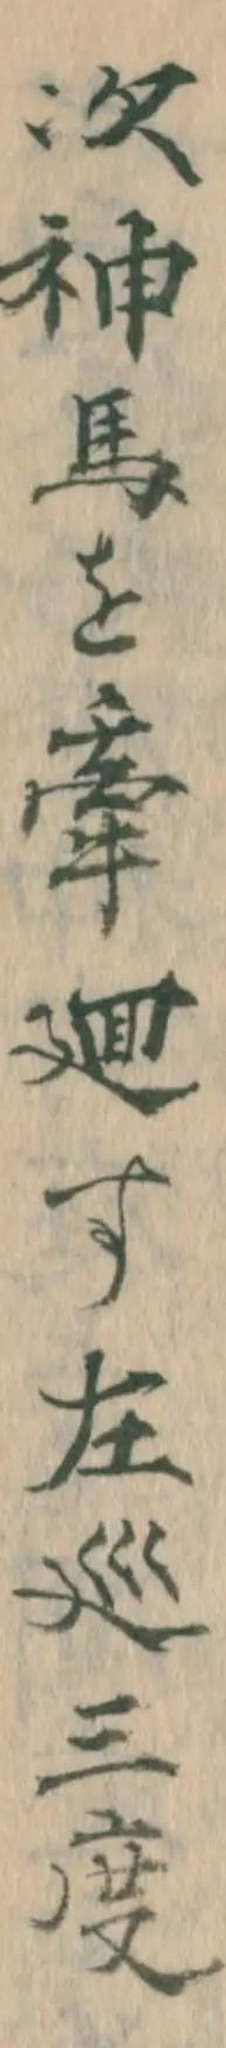次神馬を牽廻す左巡三度
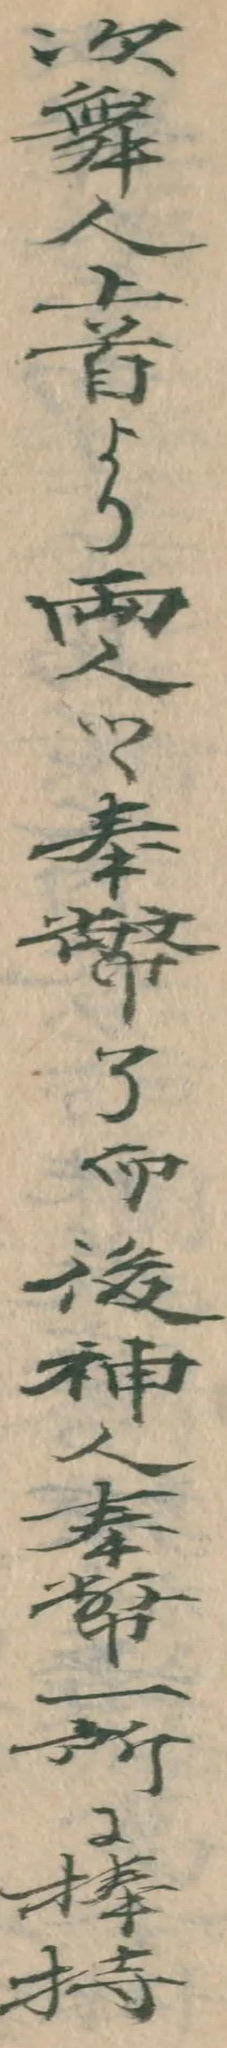次舞人上首より両人つゝ奉幣了而後神人奉幣一所に捧持
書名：賀茂社記録. 第9冊
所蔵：国立国会図書館 National Diet Library, JAPAN
